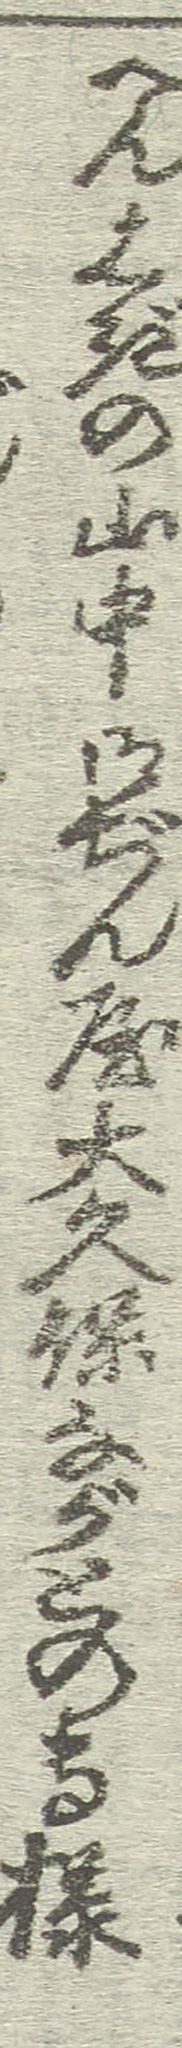へんはぎの山中御ぢん屋大久保ながとの守様
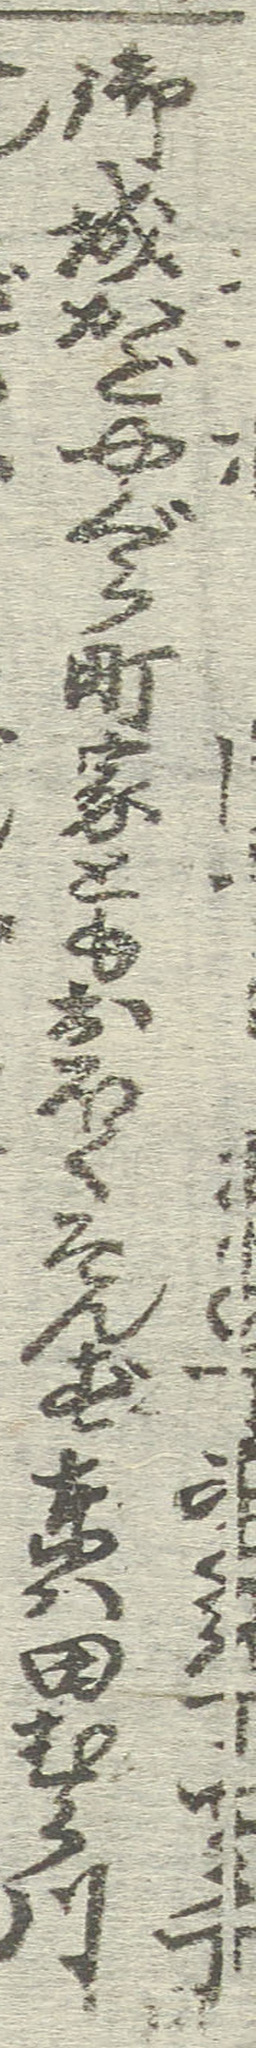御城かどやぐら町家ともおほくそんず東は田むら川
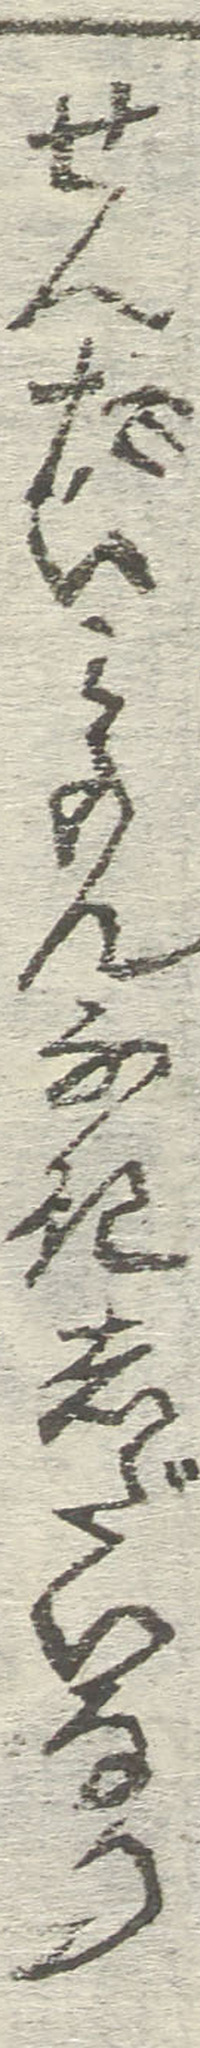せんたいみもんなきしだいなり
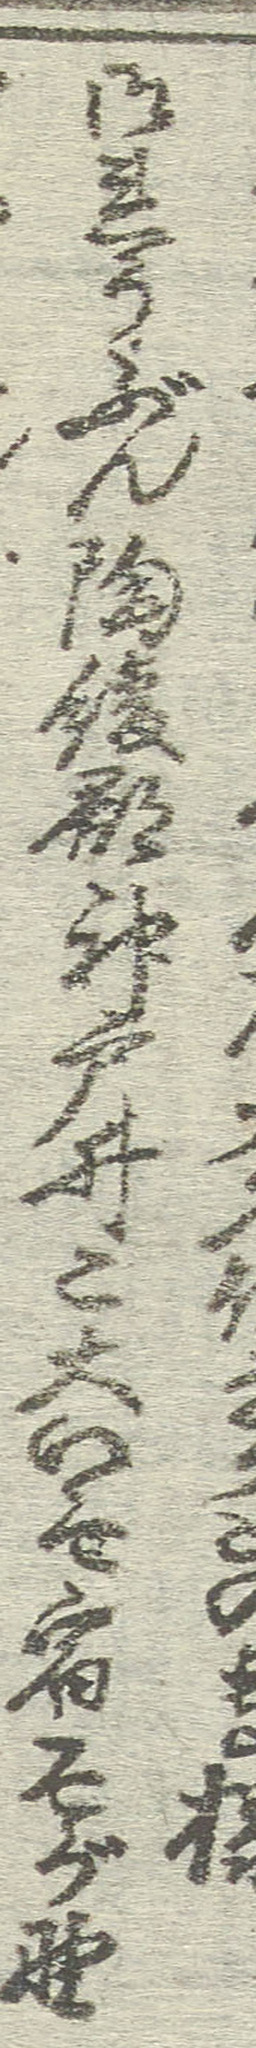御れうぶん陶綾郡神戸井と大いそ宿そが野
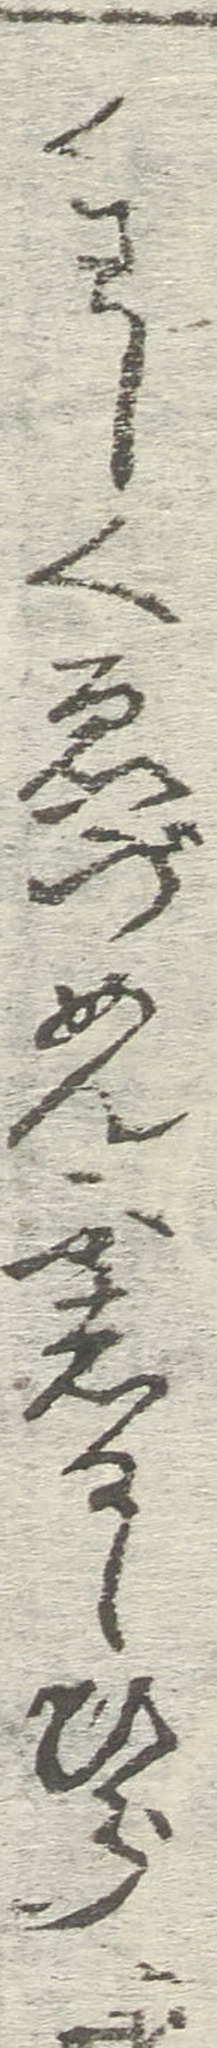くわしくゑづめんにしるしひら
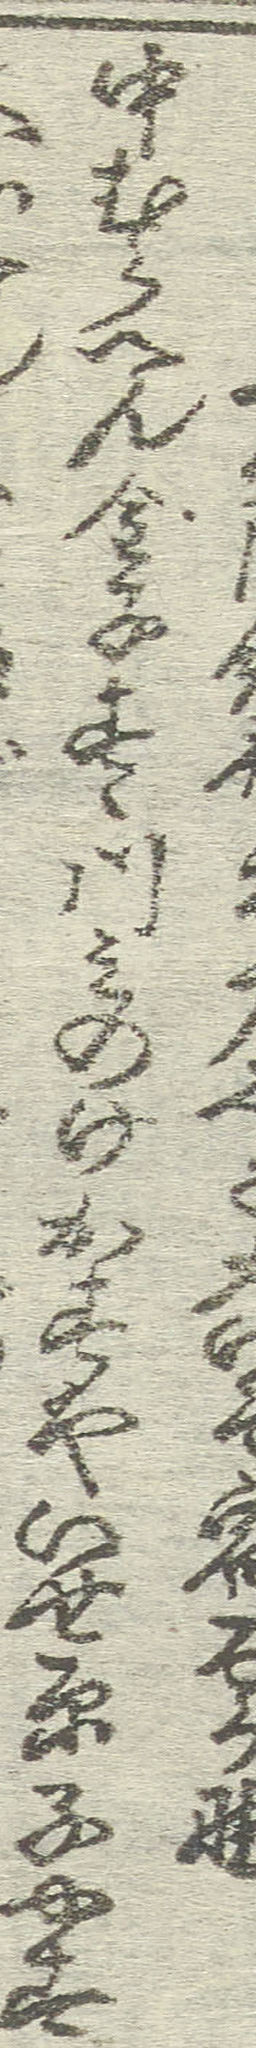中むらへん金子すゝ川みのけかすやいせ原子やす
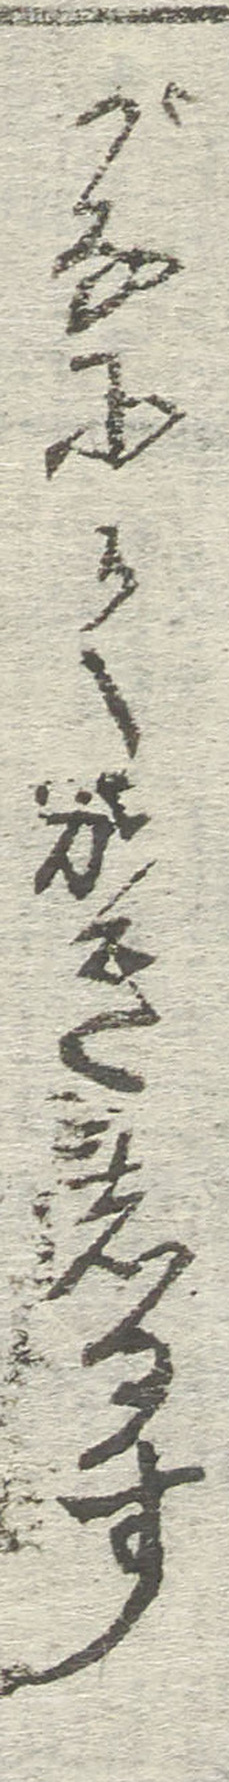がなにてかきしるす
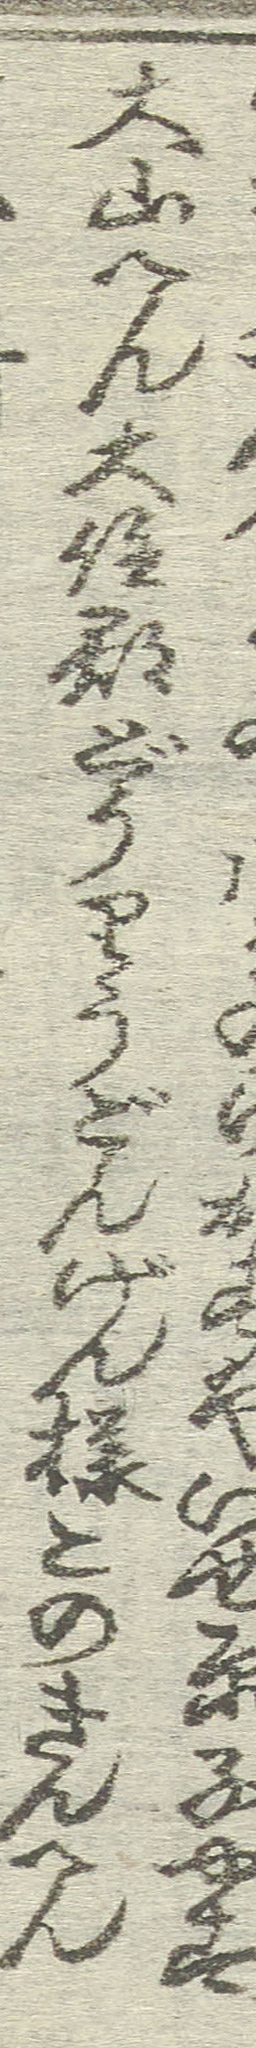大山へん大住郡どうりうごんげん様このきんへん
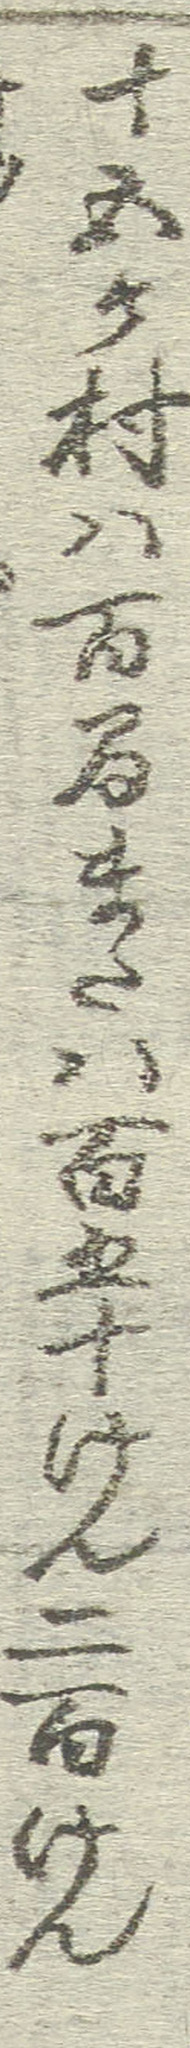十五ケ村は百間または百五十けん二百けん
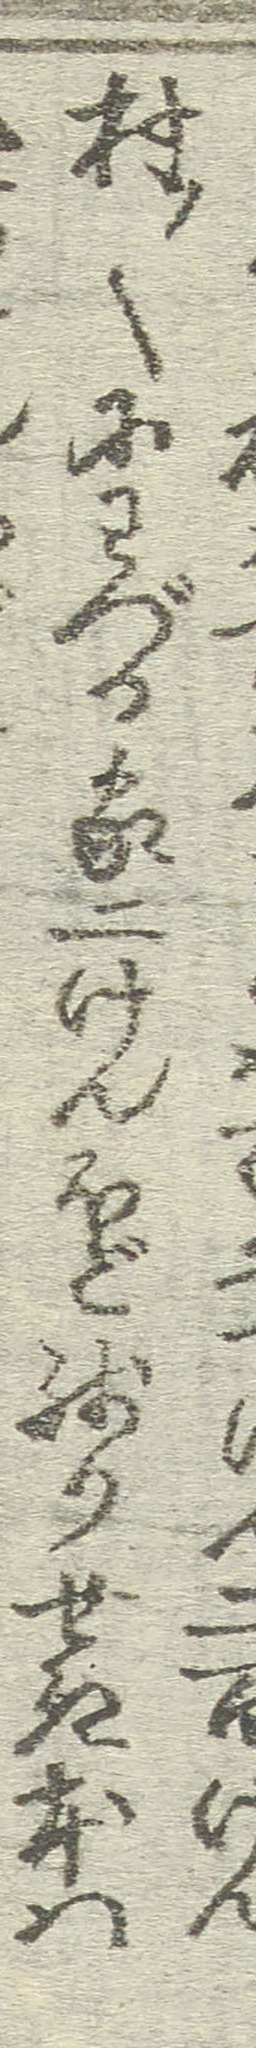村〳〵にわづか家二けんほど残りせき本は
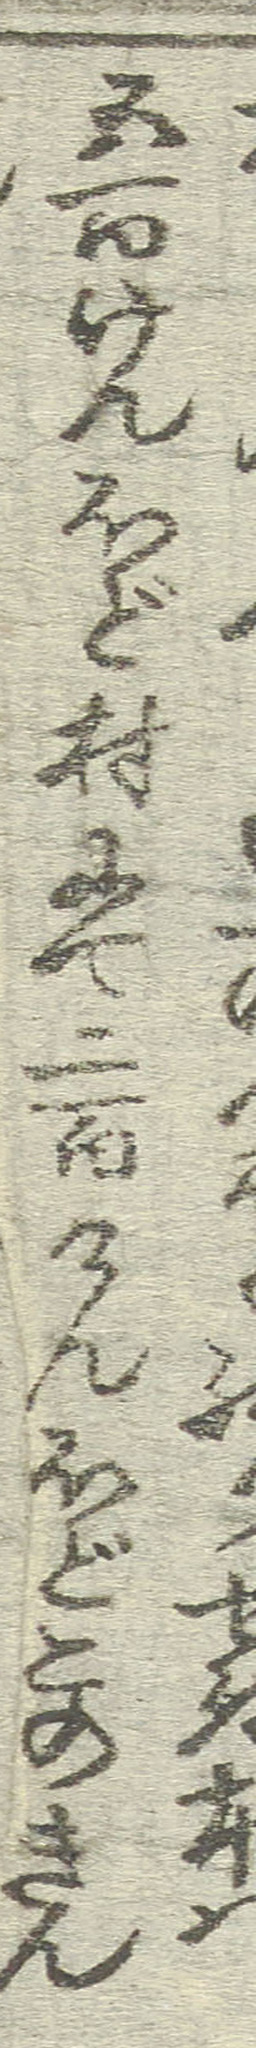五百けんほど村にて二百けんほどこのきん
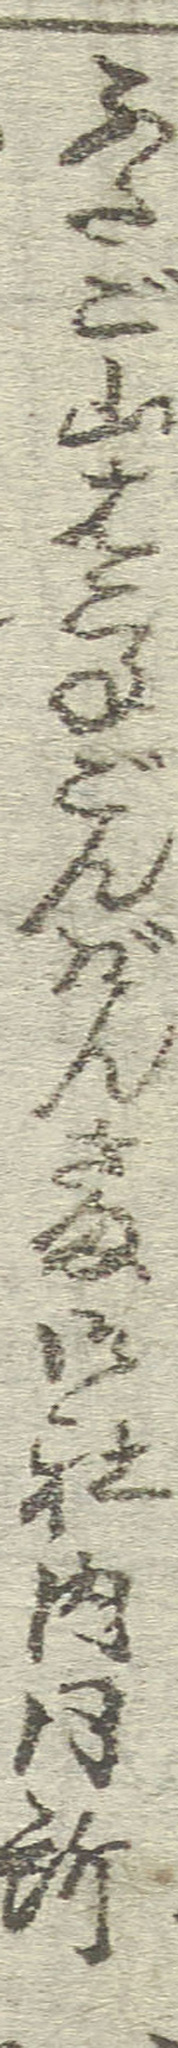ふたご山はこねごんげんさま御社内同所
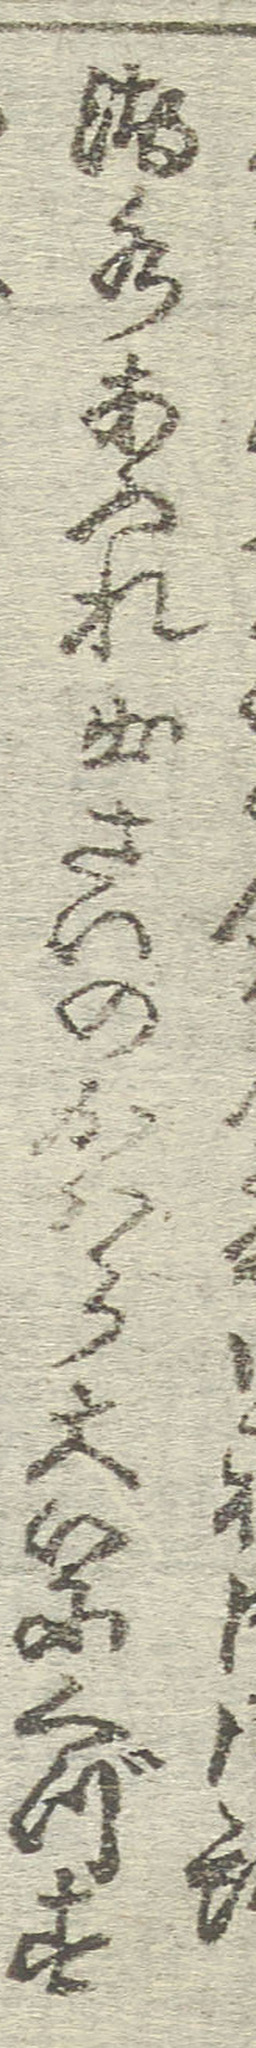湖水あふれ出さいのかはら大いにくづす
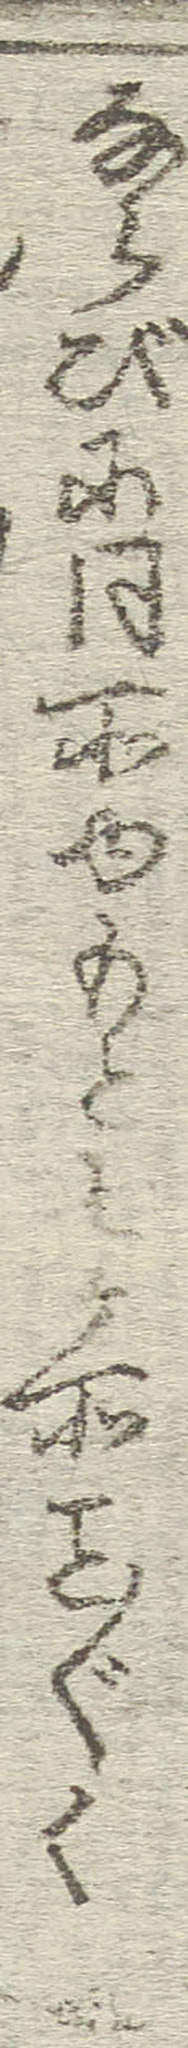ならびに同所ゆもと七ケ所こと〴〵く
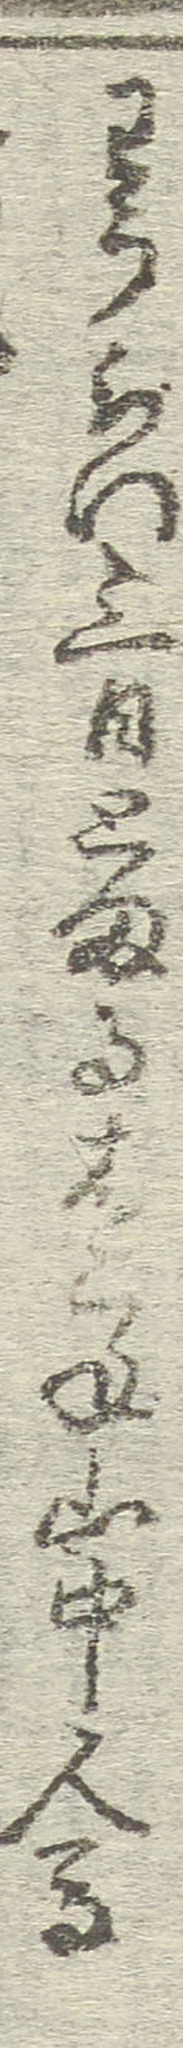わうらい三日とまるはこね山中人馬
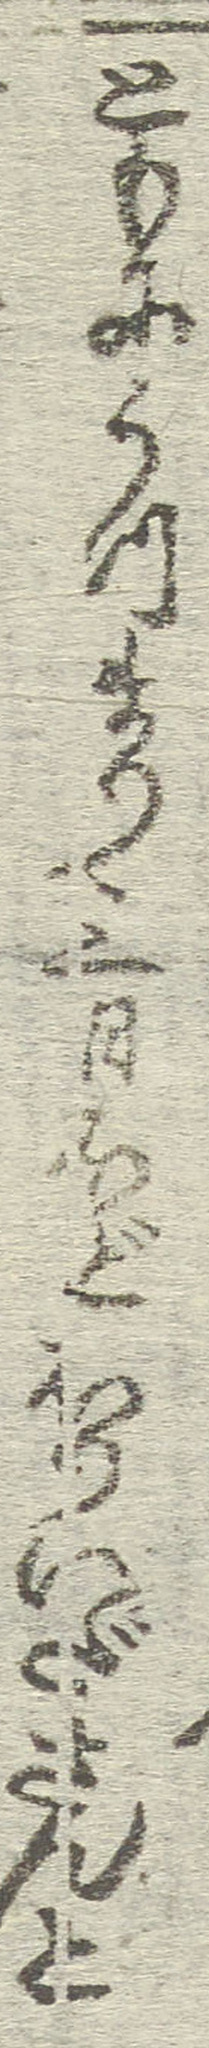ともにうつまり三日ほどほりいださんと
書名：伊豆下田小田原箱根大地震之図
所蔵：東京大学総合図書館 General Library in the University of Tokyo, JAPAN
